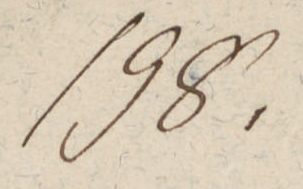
198.
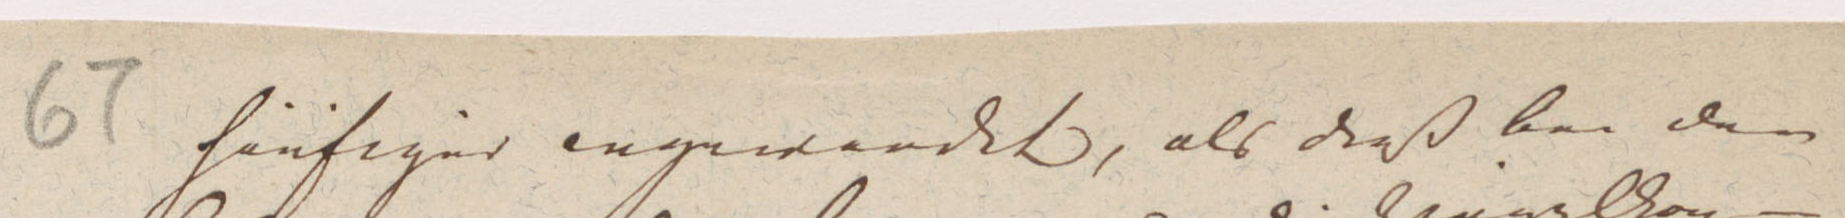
häufiger angewendet, als dass bei den
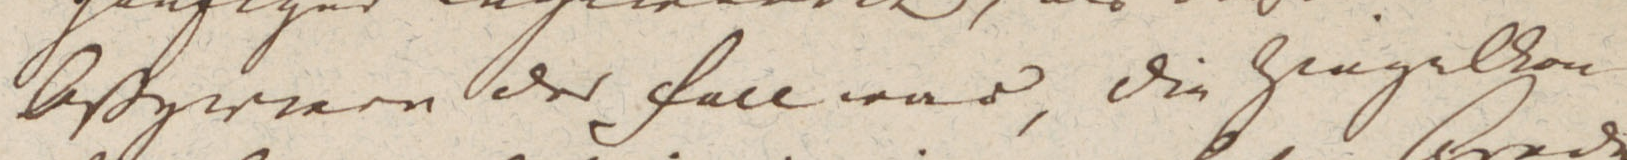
Assyriern der Fall war, die Ziegelkon-
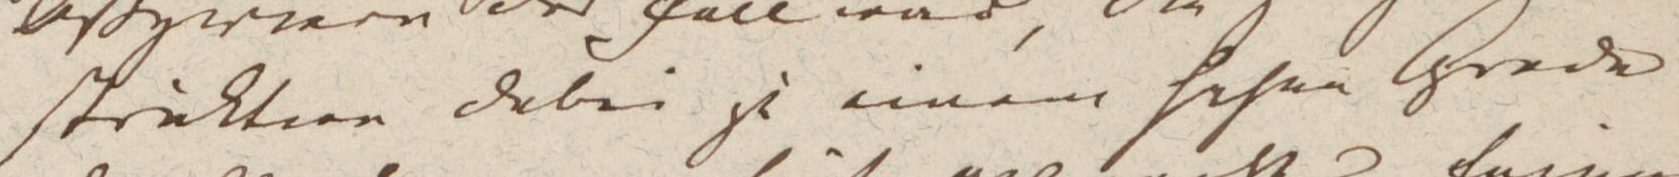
struktion dabei zu einem hohen Grade
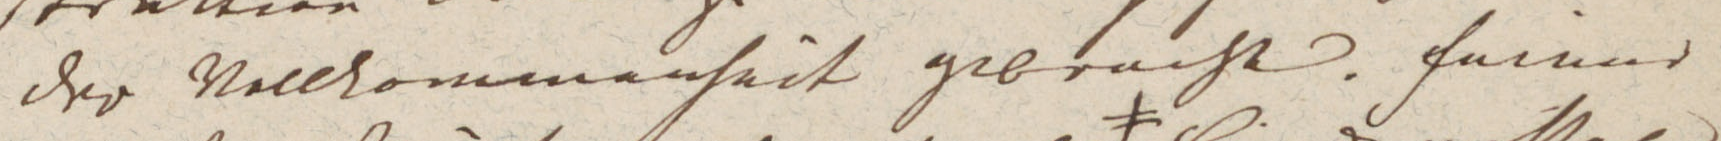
der Vollkommenheit gebracht. Feiner
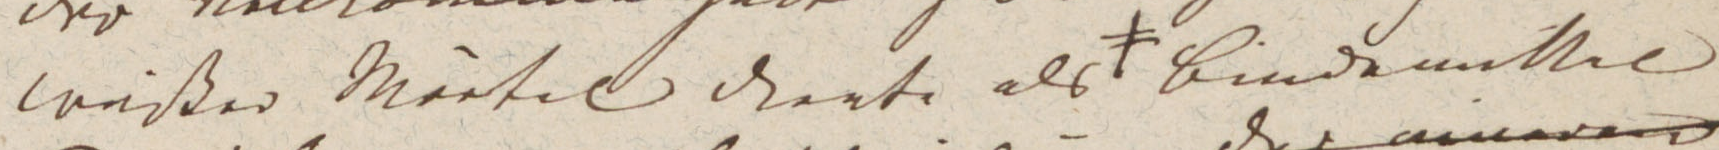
weisser Mörtel diente als % Bindemittel
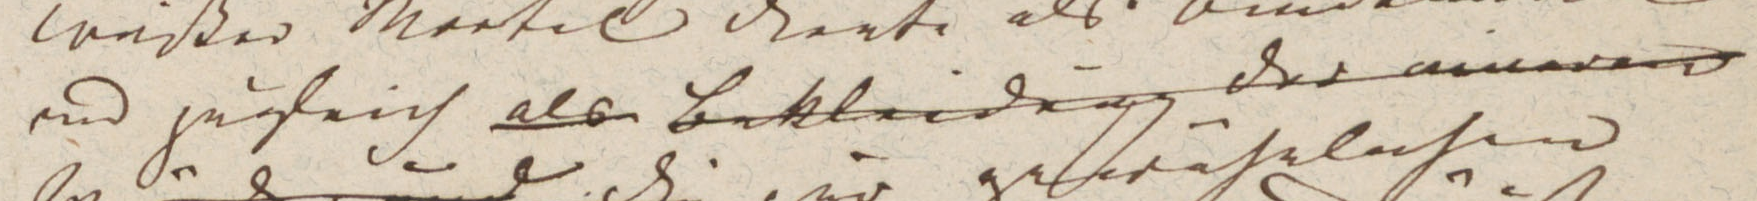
und zugleich als Bekleidung der inneren
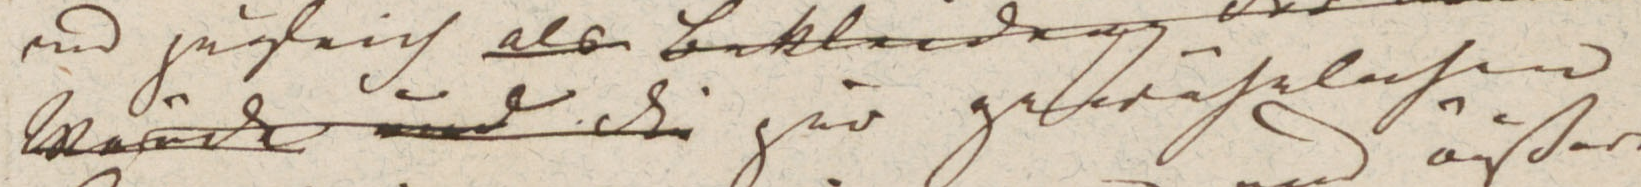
Wände und die zur gewöhnlichen
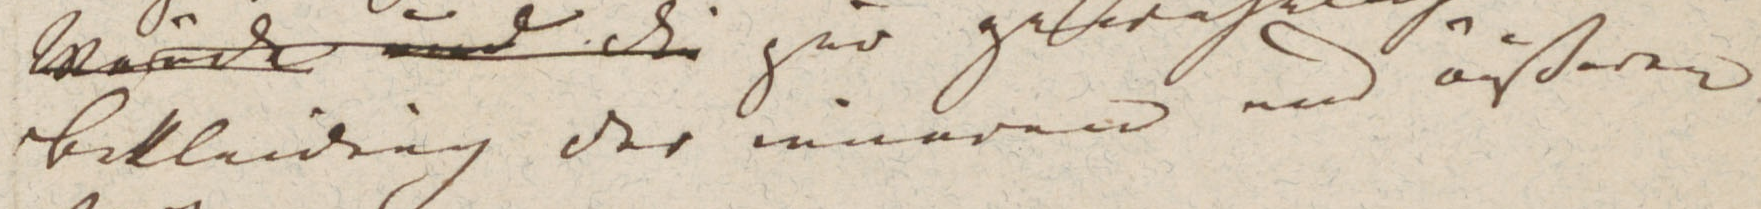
Bekleidung der inneren und äusseren
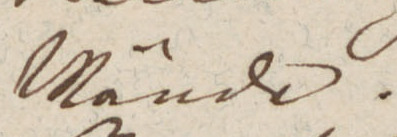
Wände.
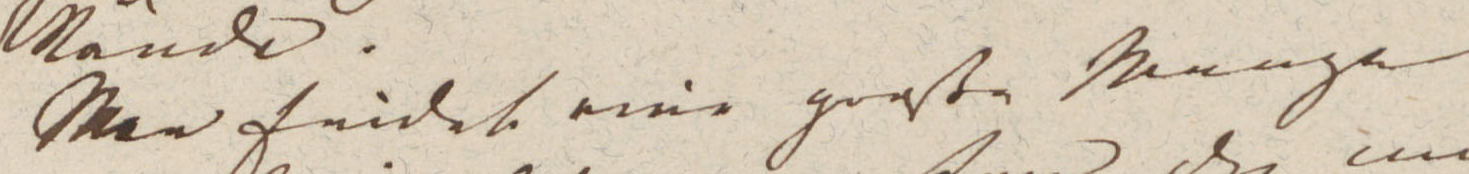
Man feidet eine grosse Menge
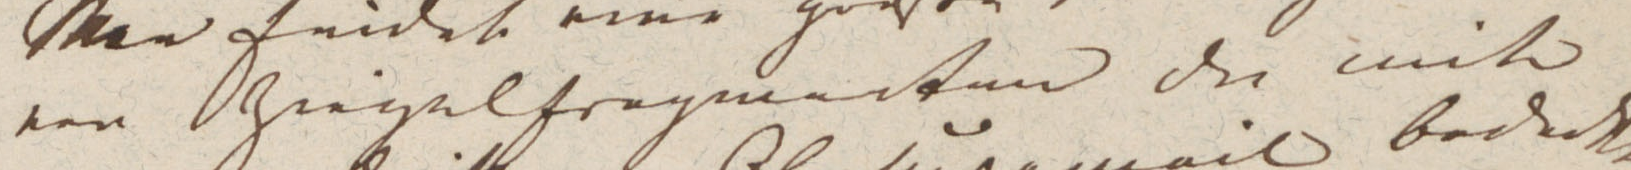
von Ziegelfragmenten die mit
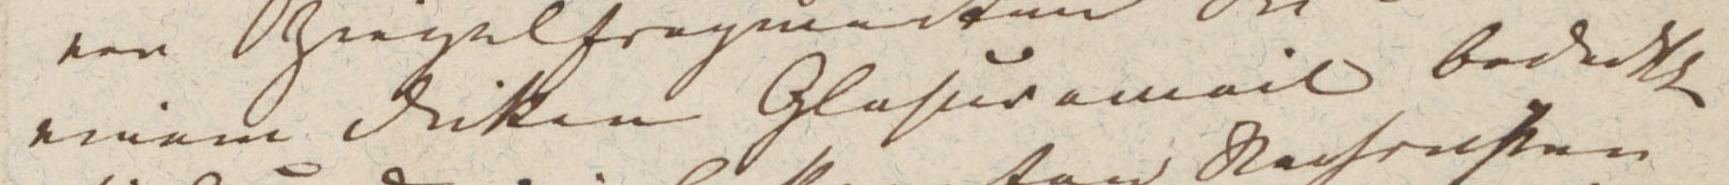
einem dicken Glasuremail bedeckt
